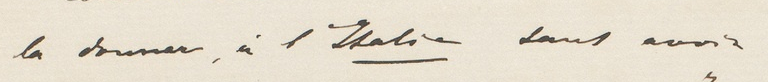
la donner, à l'Italie sans avoir
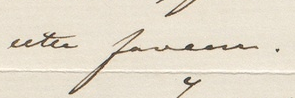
cette faveur.
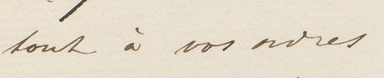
tout à vos ordres.
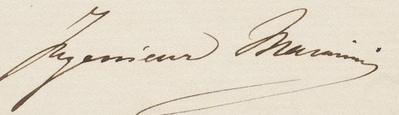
Ingenieur Maraini
